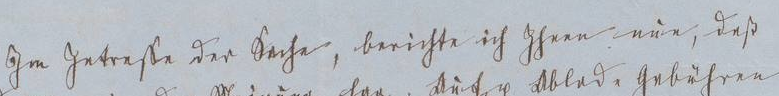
Im Intresse der Sache, berichte ich Ihnen nur, daß
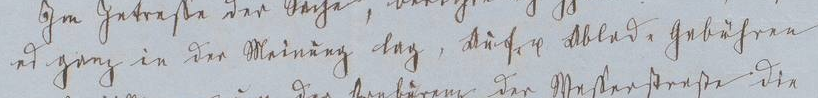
es ganz in der Meinung lag, Auf- & Ablad- Gebühren
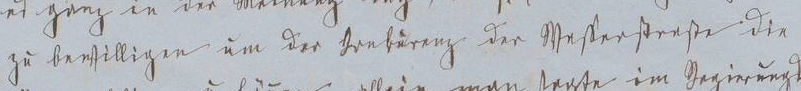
zu bewilligen um der Konkurenz der Wasserstraße die
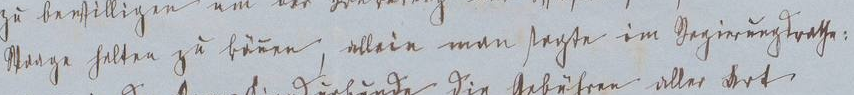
Waage halten zu können, allein man sagte im Regierungsrathe:
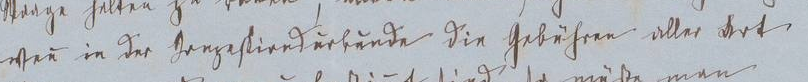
wenn in der Konzeßionsurkunde die Gebühren aller Art
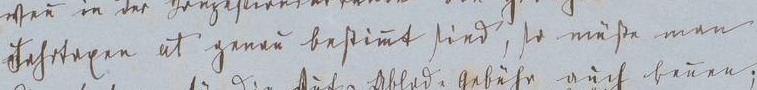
Fahrtaxen ect genau bestimmt sind, so müße man
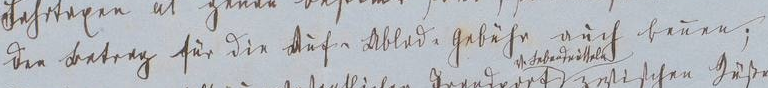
den Betrag für die Auf- Ablad- Gebühr auch kennen;
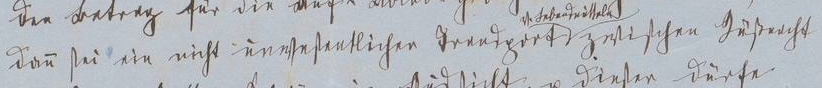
dann sei ein nicht unwesentlicher Transport v. Lebensmitteln zwischen Küßnacht
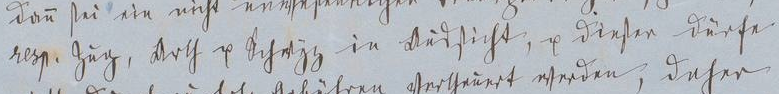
resp. Zug, Arth & Schwyz in Aussicht, & dieser dürfe
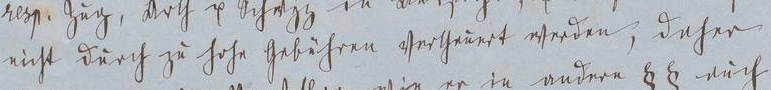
nicht durch zu hohe Gebühren vertheuert werden, daher
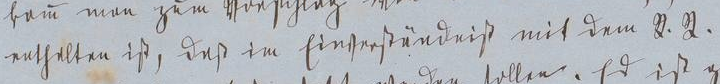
enthalten ist, daß im Einverständniß mit dem R.R.
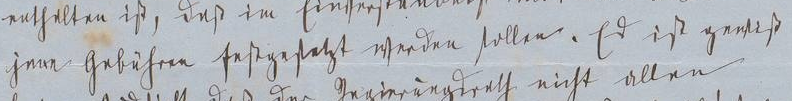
jene Gebühren festgesetzt werden sollen. Es ist gewiß
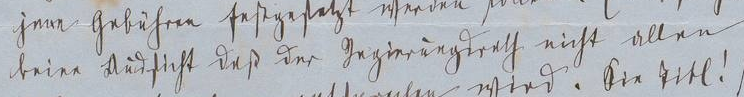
keine Aussicht daß der Regierungsrath nicht allen
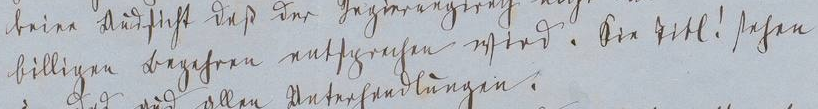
billigen Begehren entsprechen wird. Sie Titl! sehen
